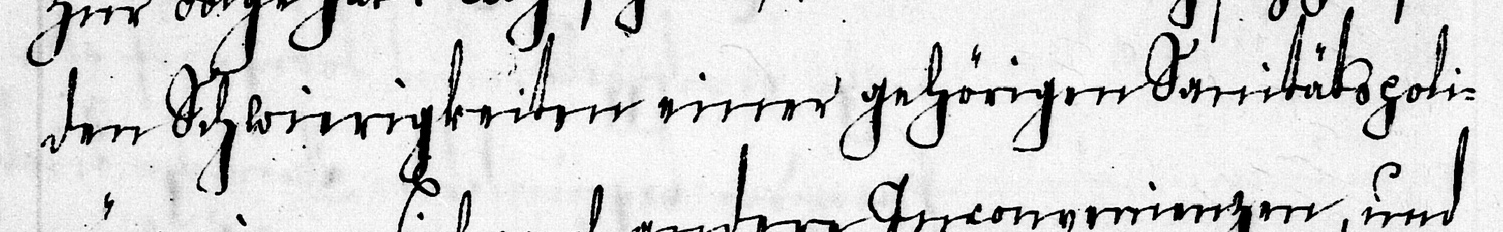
den Schwierigkeiten einer gehörigen Sanitätspoli¬
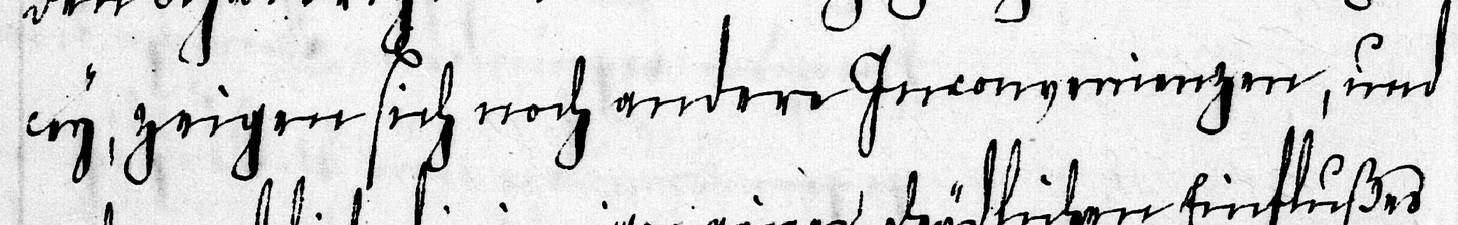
cey, zeigen sich noch andere Inconvenienzen, und
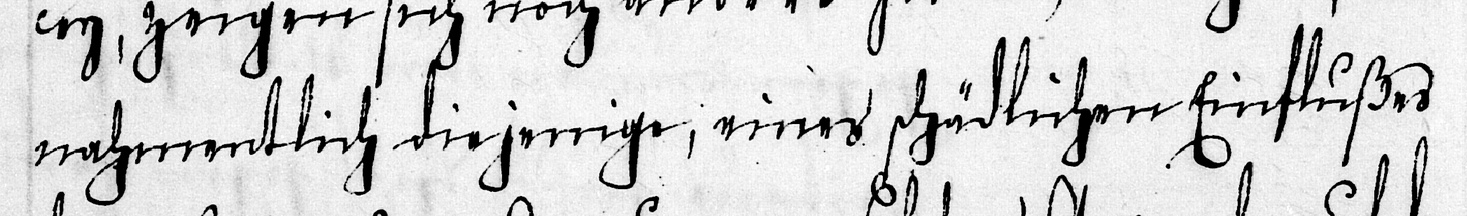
nahmentlich diejenige, eines schädlichen Einflußes
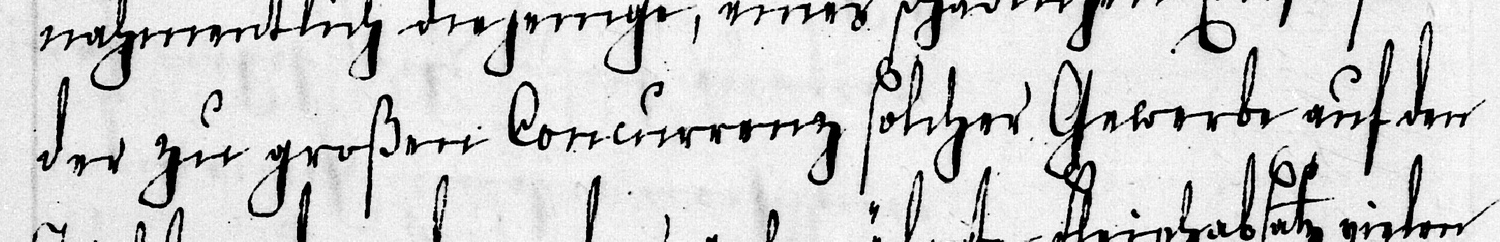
der zu großen Concurrenz solcher Gewerbe auf den
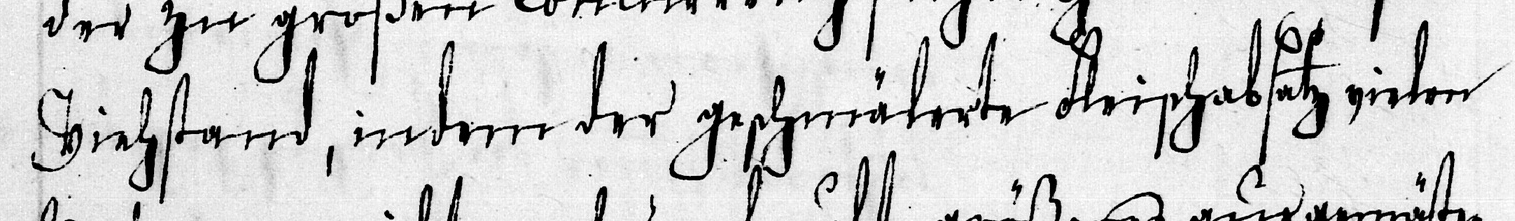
Viehstand, indem der geschmälerte Fleischabsatz vielen
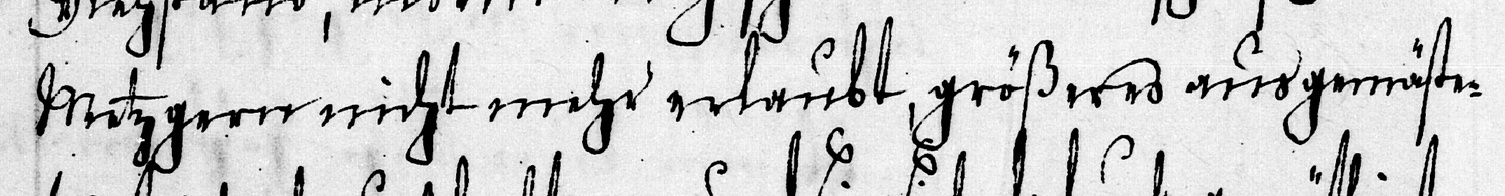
Metzgern nicht mehr erlaubt, größeres ausgemäste¬
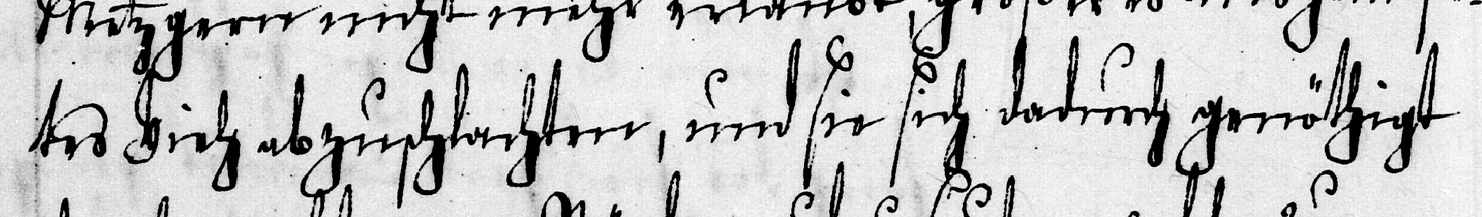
tes Vieh abzuschlachten, und sie sich dadurch genöthigt
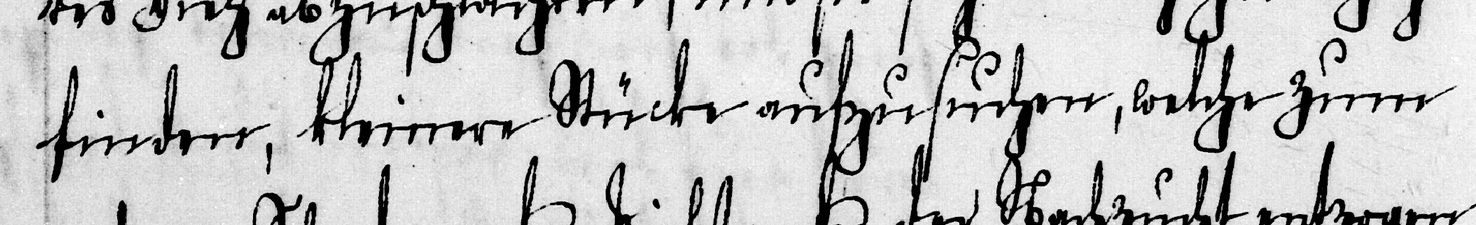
finden, kleinere Stücke aufzusuchen, welche zum
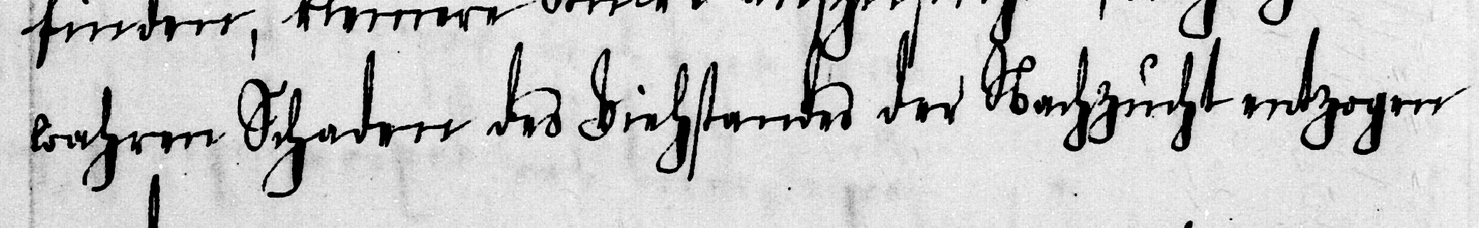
wahren Schaden des Viehstandes der Nachzucht entzogen
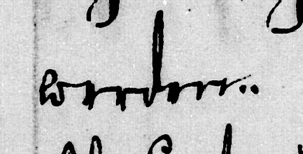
werden.
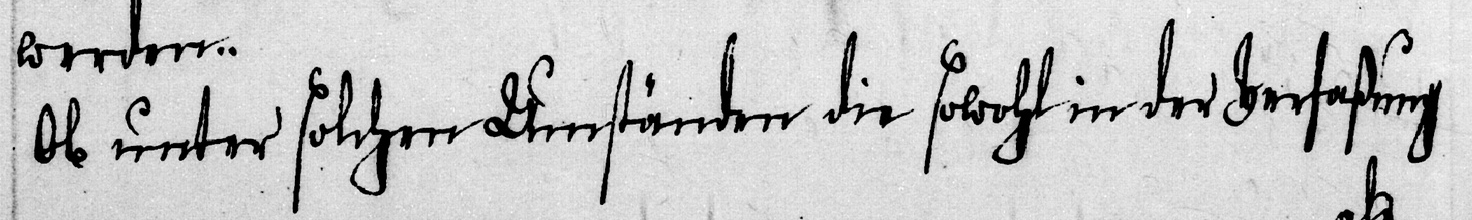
Ob unter solchen Umständen die sowohl in der Verfaßung
